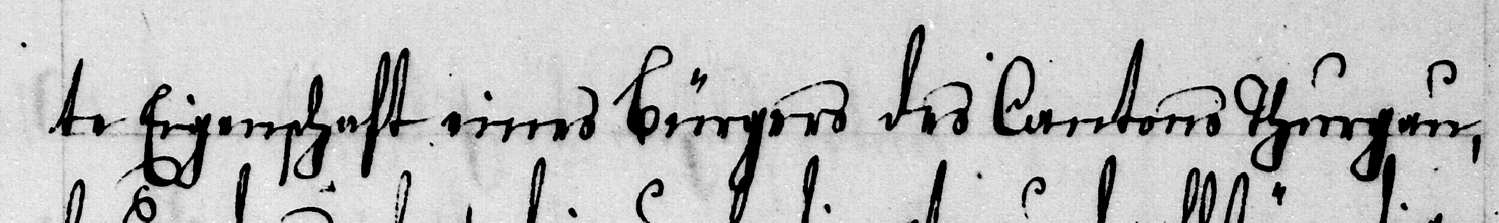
te Eigenschaft eines Bürgers des Cantons Thurgau,
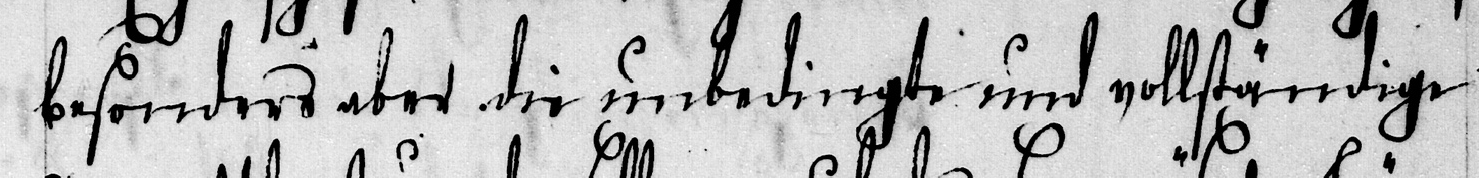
besonders aber die unbedingte und vollständige
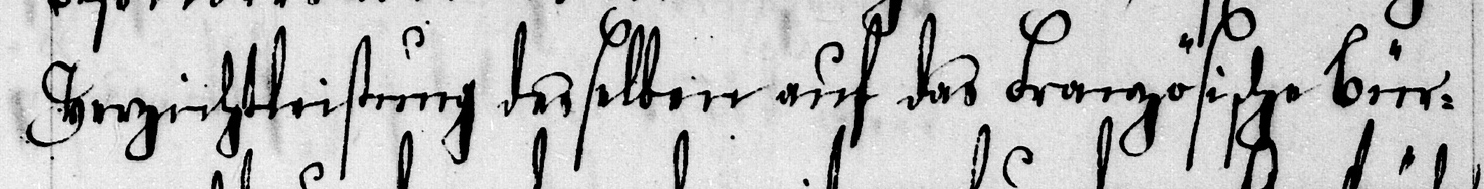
Verzichtleistung desselben auf das Französische Bür¬
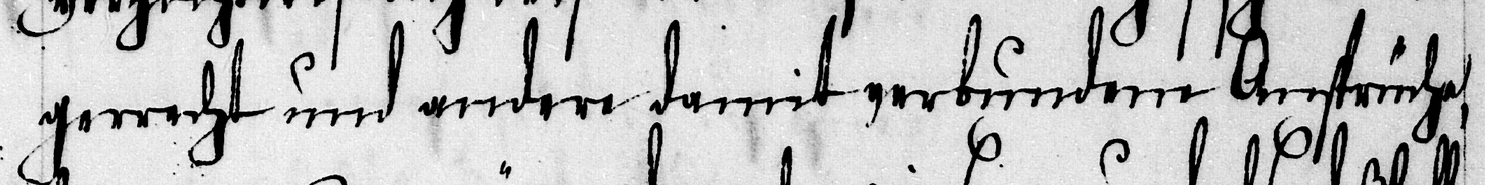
gerrecht und andere damit verbundene Ansprüche,
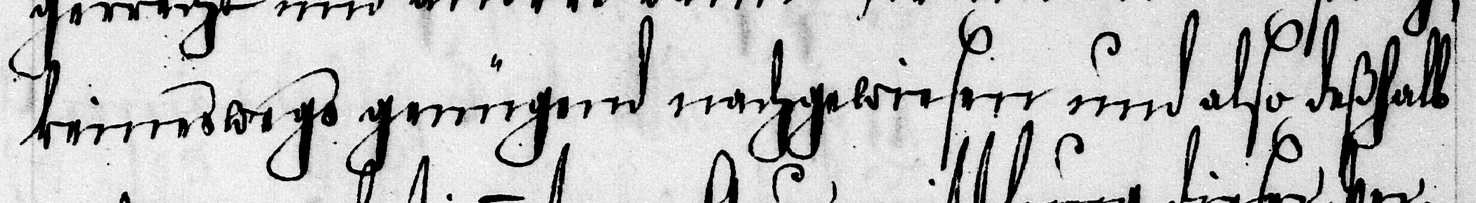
keineswegs genügend nachgewiesen und also deßhalb
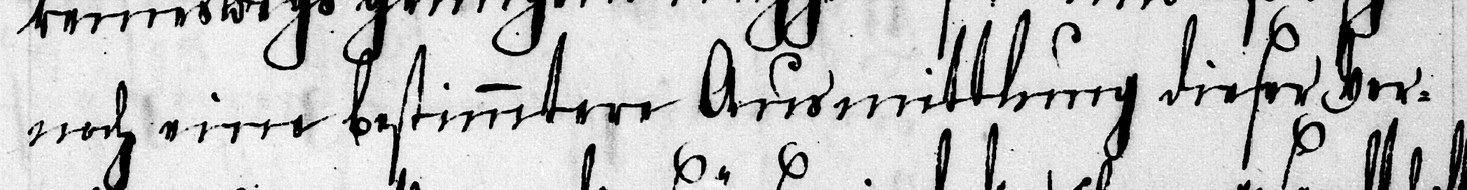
noch eine bestimmtere Ausmittlung dieser Ver¬
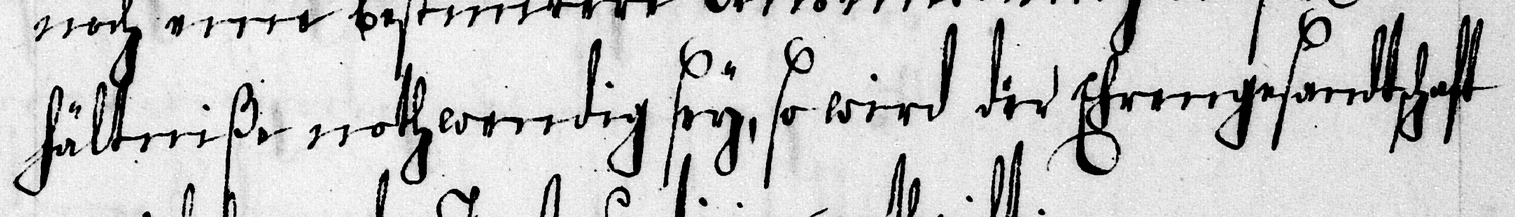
hältniße nothwendig sey, so wird der Ehrengesandtschaft
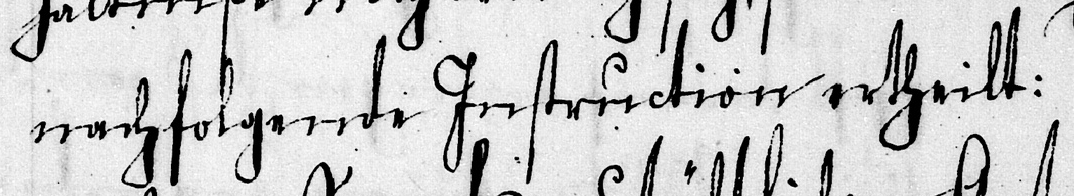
nachfolgende Instruction ertheilt:
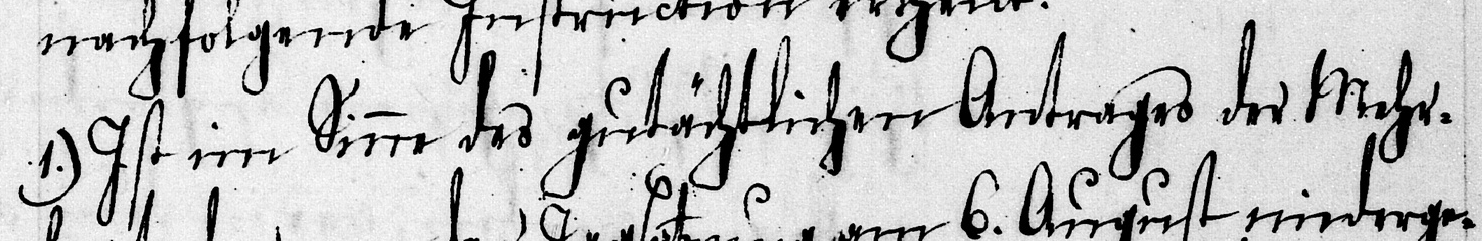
1.) Ist im Sinne des gutächtlichen Antrages der Mehr¬
